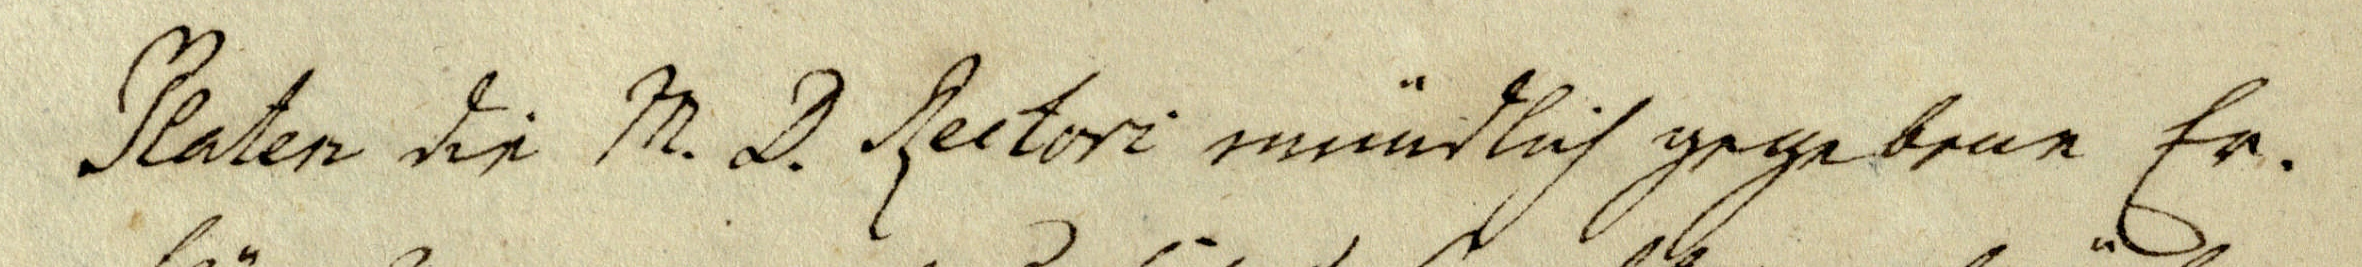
Platen die M. D. Rectori mündlich gegebene Er¬
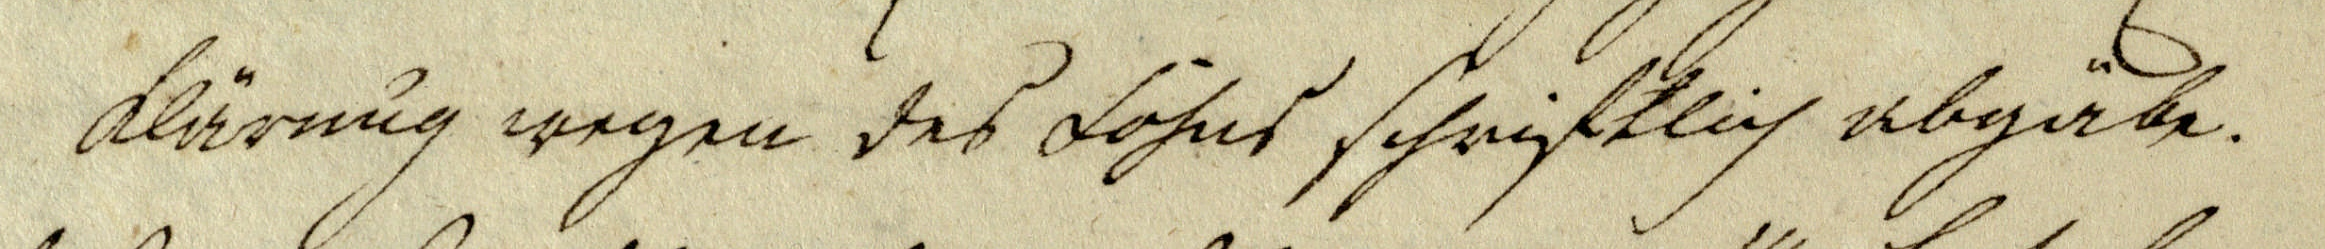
klärung wegen des Lohns schriftlich abgäbe.
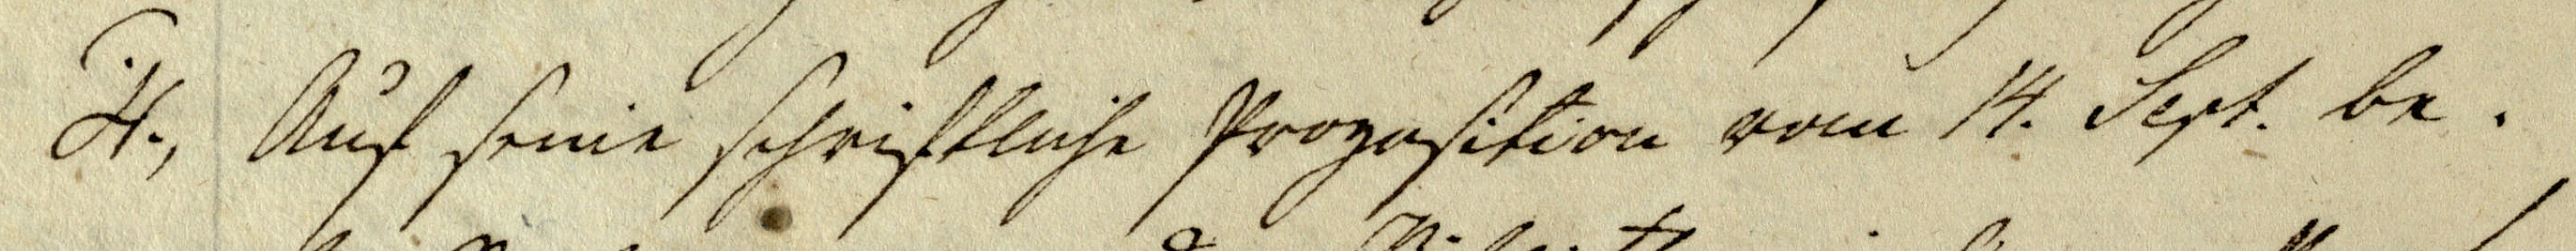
4., Auf seine schriftliche Proposition vom 14. Sept. be¬
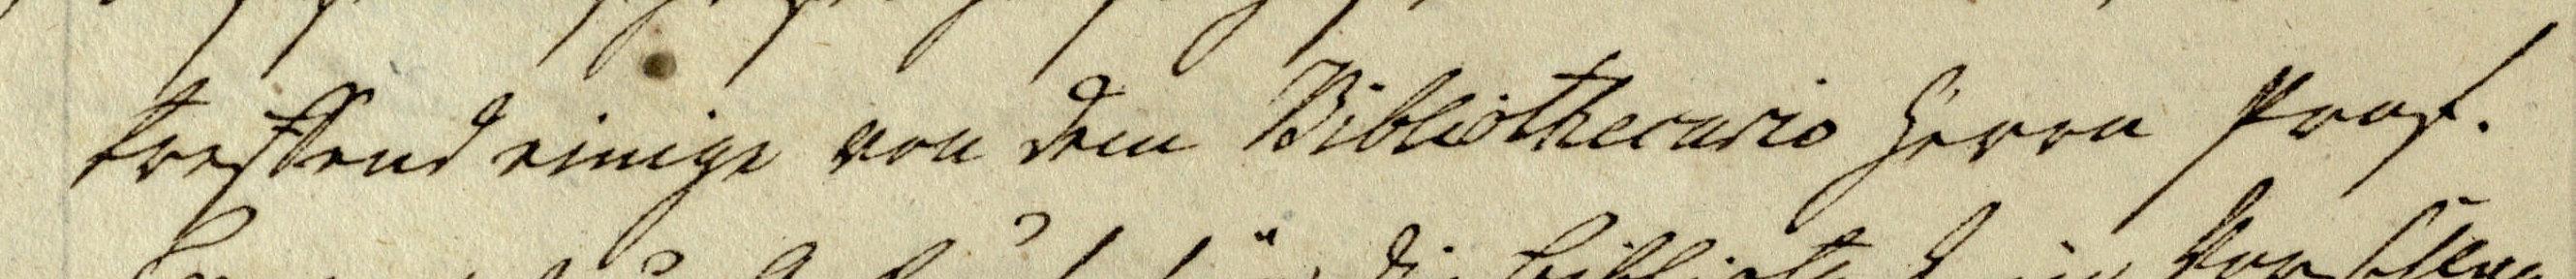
treffend einige von dem Bibliothecario Herrn Prof.
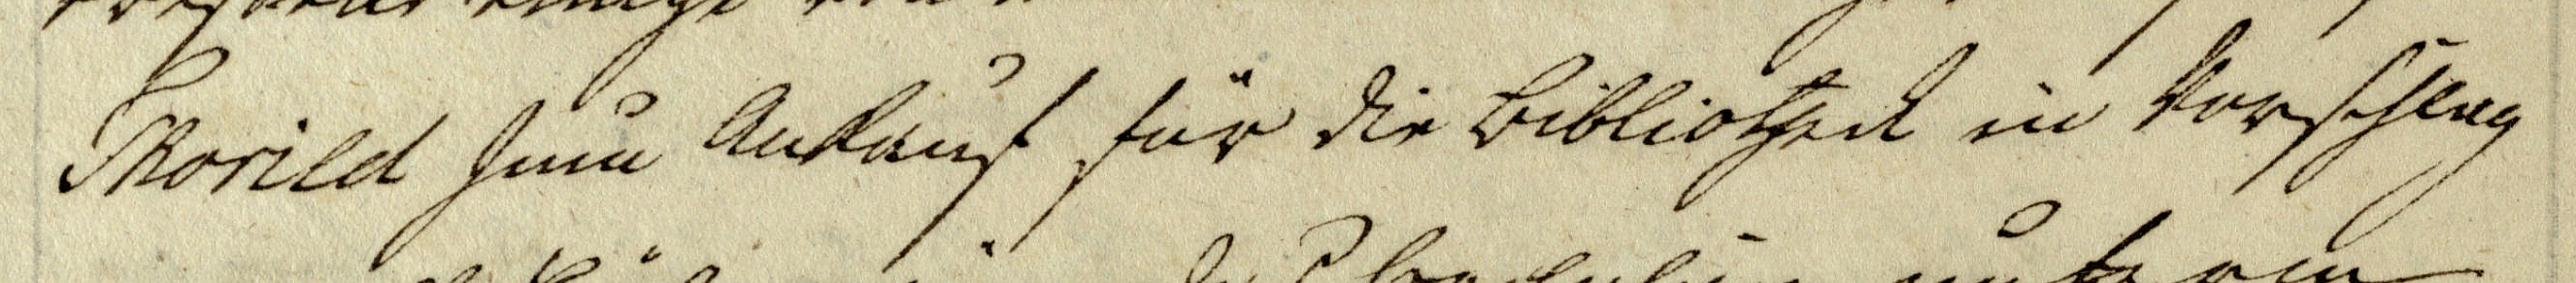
Thorild zum Ankauf für die Bibliotheck in Vorschlag
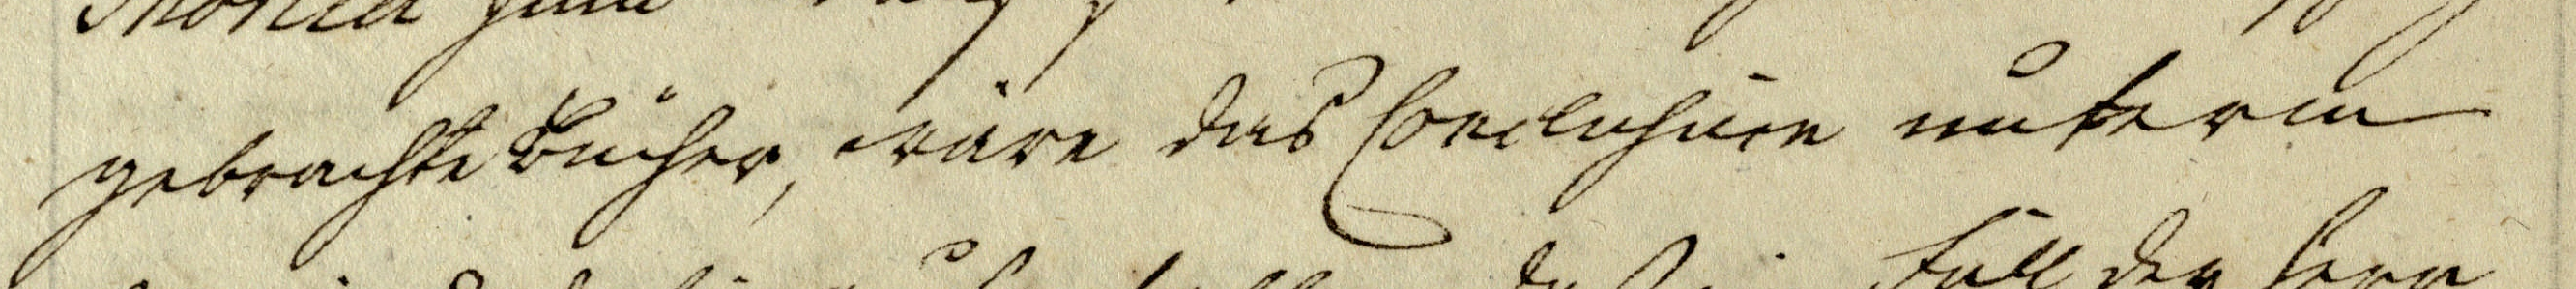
gebrachte Bücher, wäre das Conclusum unterm
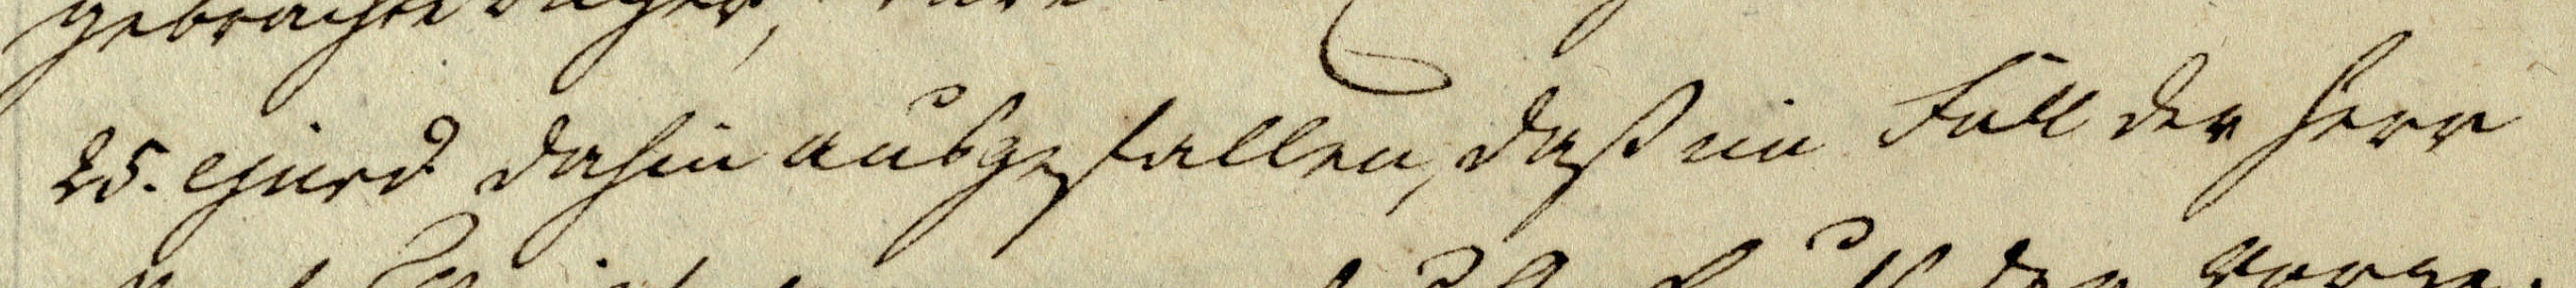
25. ejusd. dahin ausgefallen, daß im Fall der Herr
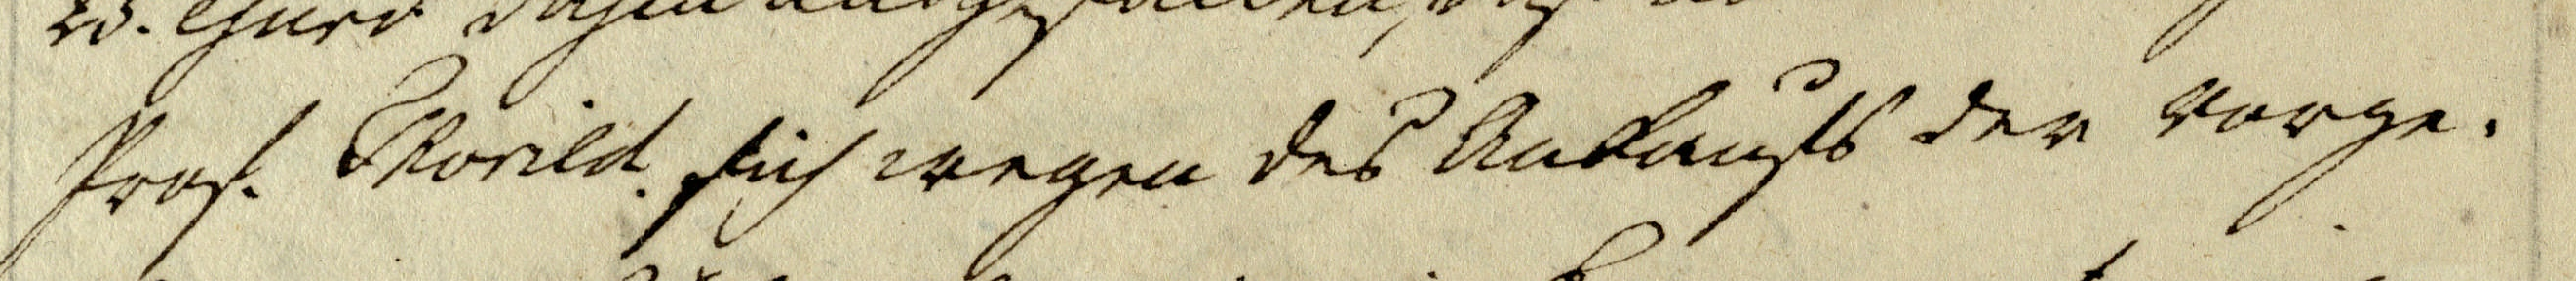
Prof. Thorild sich wegen des Ankaufs der vorge¬
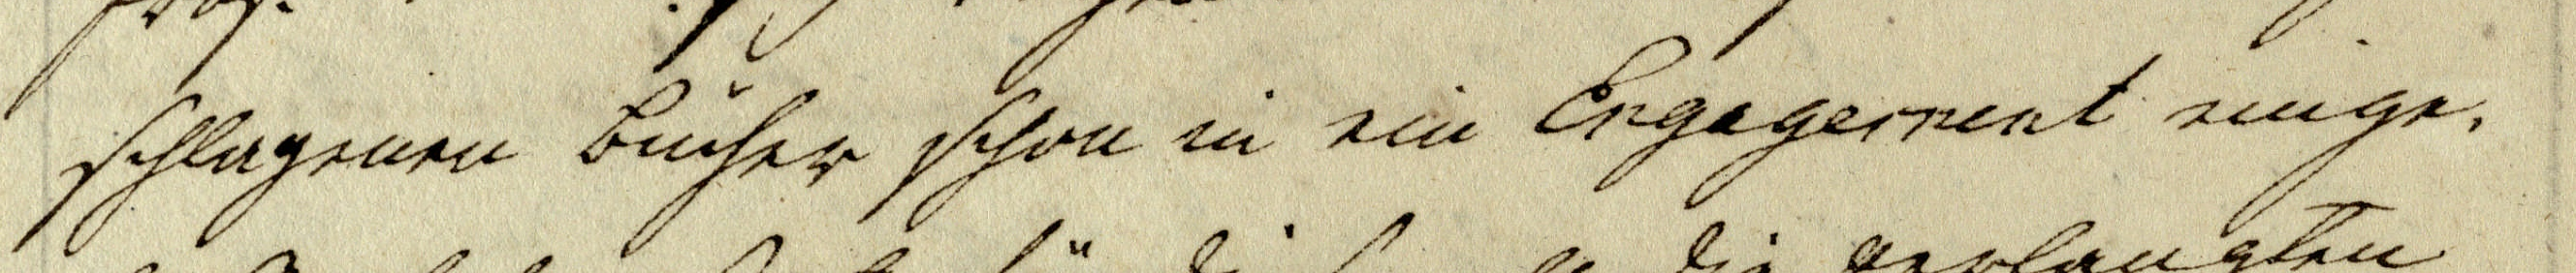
schlagenen Bücher schon in ein Engagement einge¬
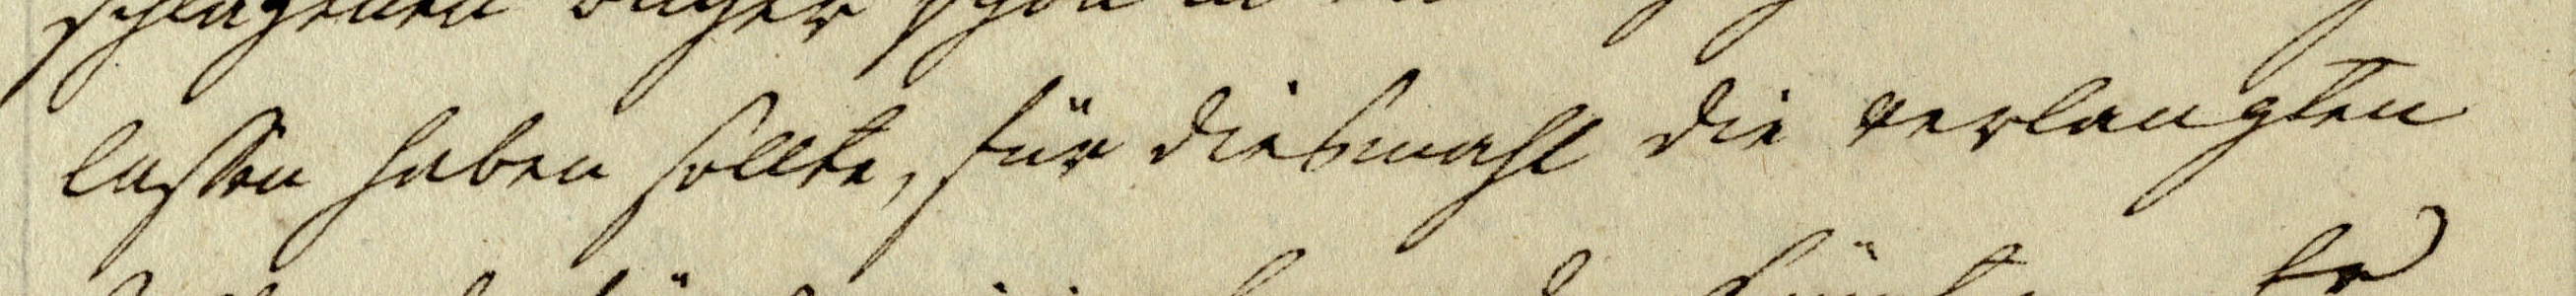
lassen haben sollte, für diesmahl die verlangten
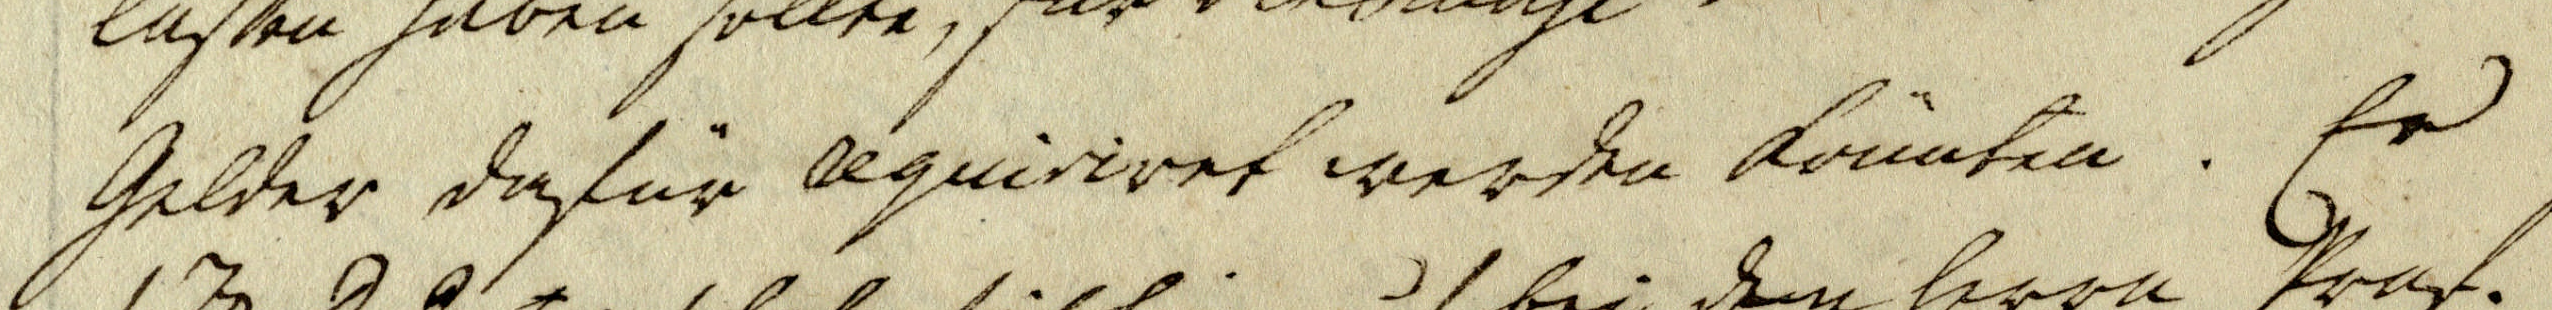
Gelder dafür requiriret werden könnten. Er
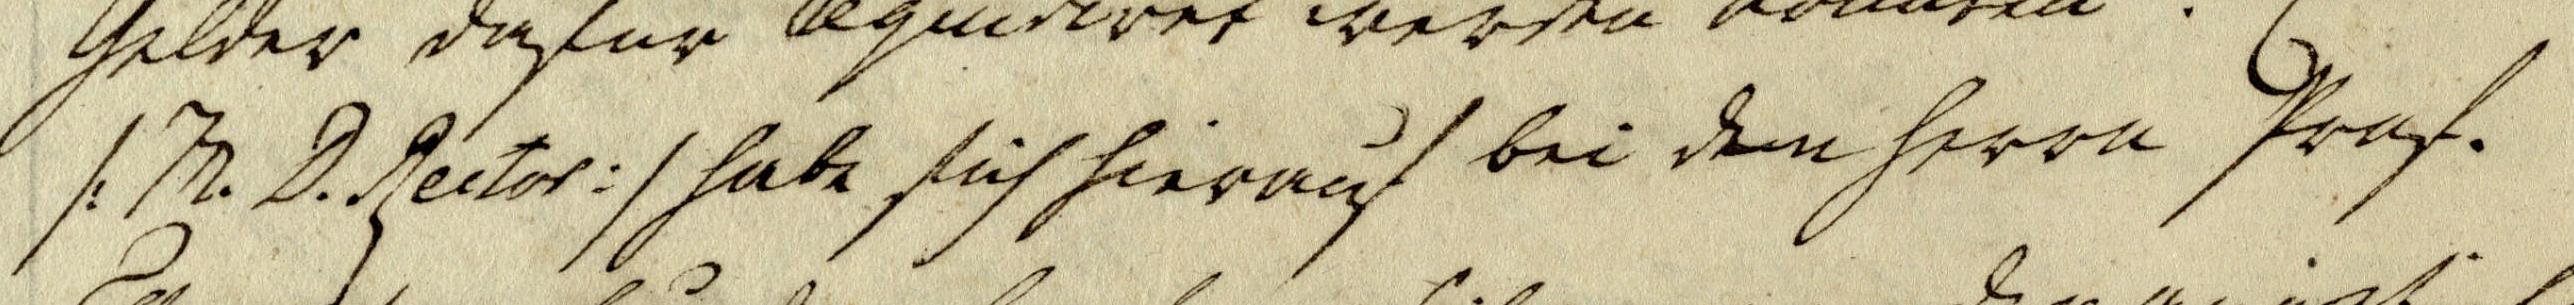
/. M. D. Rector :/ habe sich hierauf bei dem Herrn Prof.
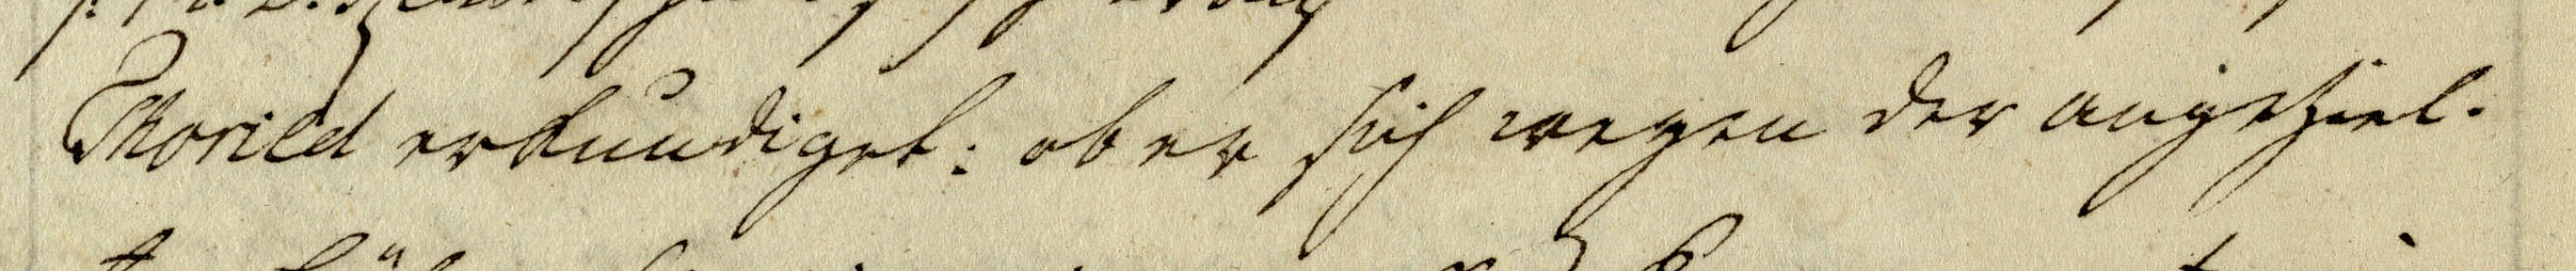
Thorild erkundiget: ob er sich wegen der angeziel¬
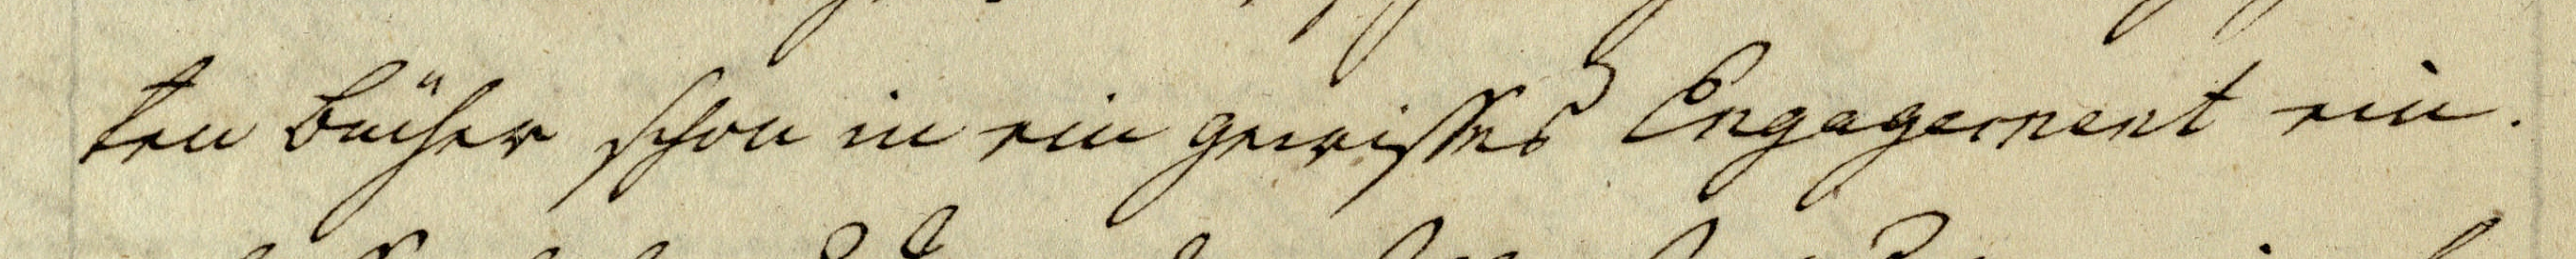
ten Bücher schon in ein gewisses Engagement ein¬
